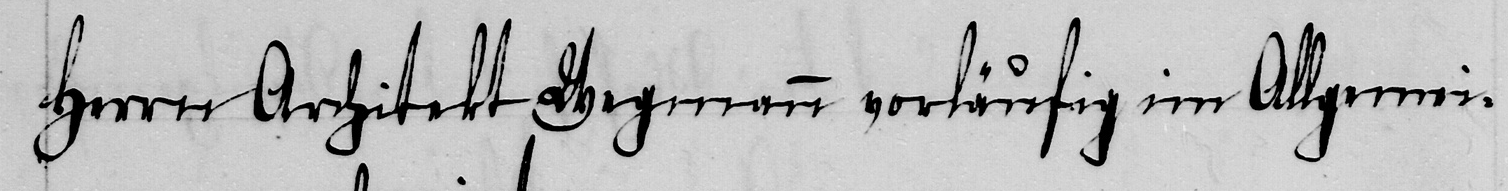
Herrn Architekt Wegmann vorläufig im Allgemei¬
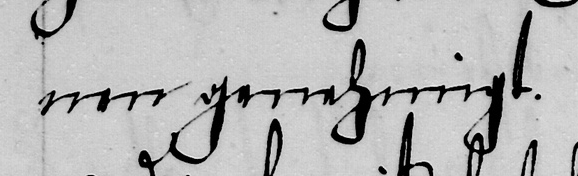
nen genehmigt.
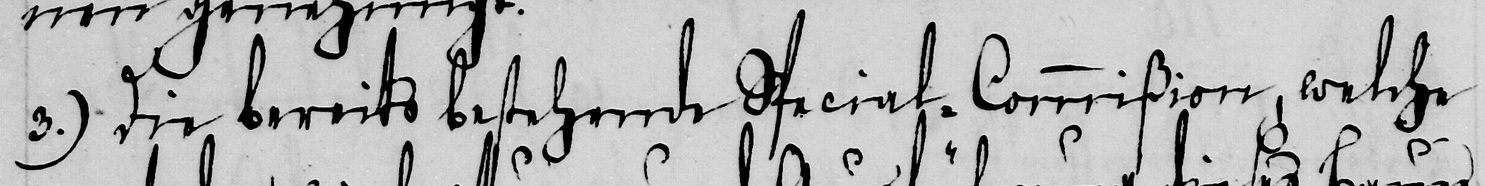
3.) Die bereits bestehende Special-Commißion, welche
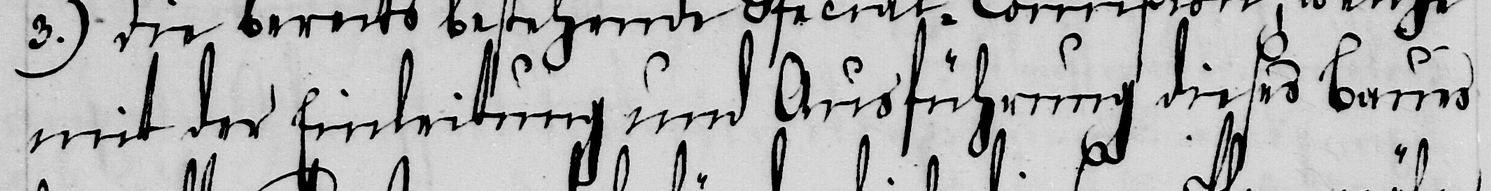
mit der Einleitung und Ausführung dieses Baues
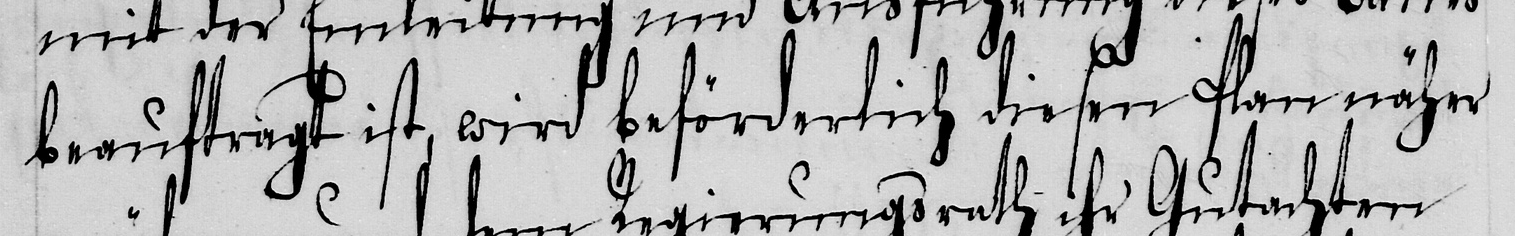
beauftragt ist, wird beförderlich diesen Plan näher
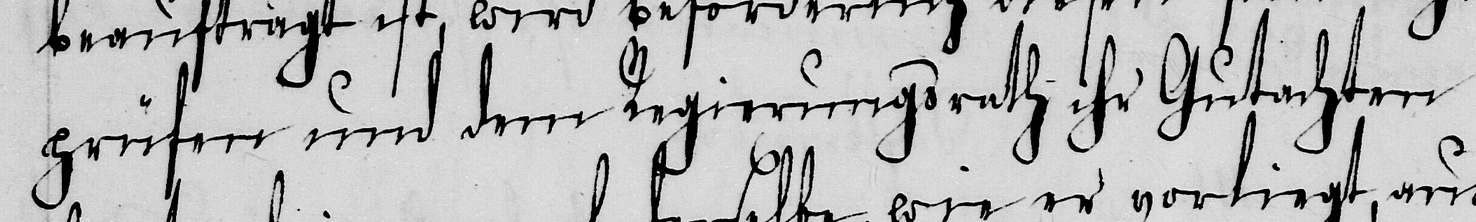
Prüfen und dem Regierungsrath ihr Gutachten
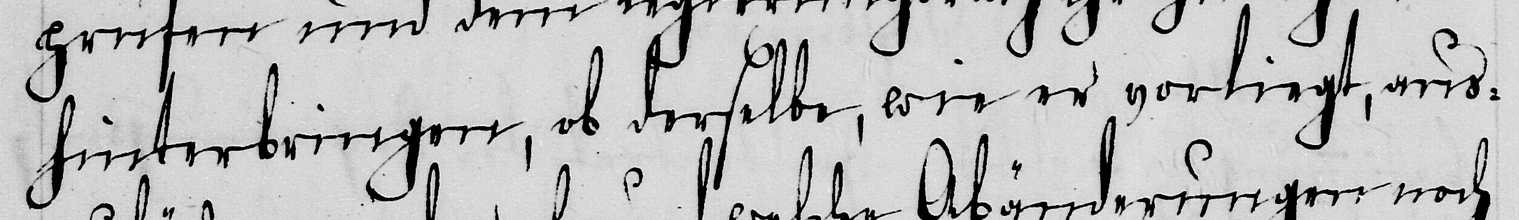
hinterbringen, ob derselbe, wie er vorliegt, aus¬
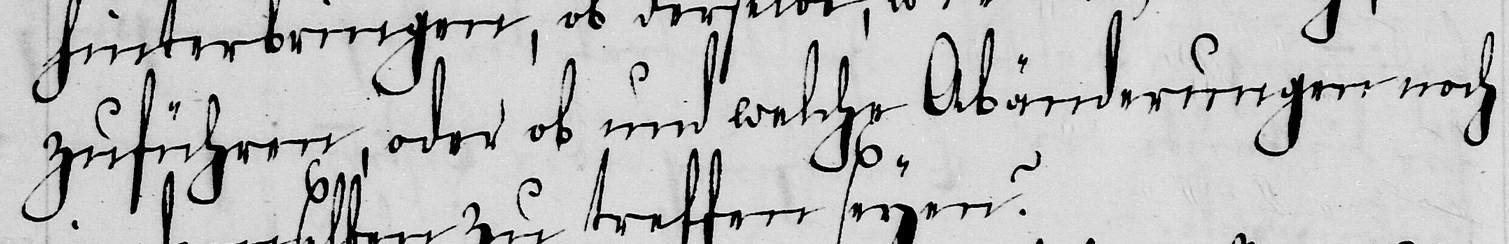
zuführen, oder ob und welche Abänderungen noch
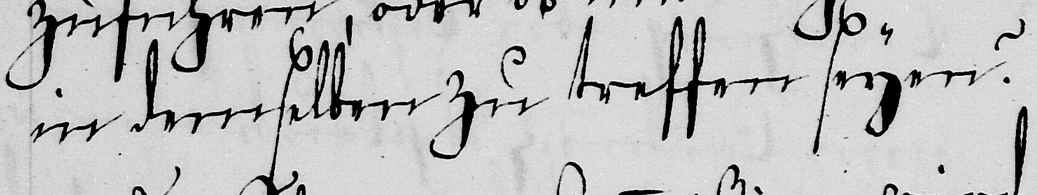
in demselben zu treffen seyen?
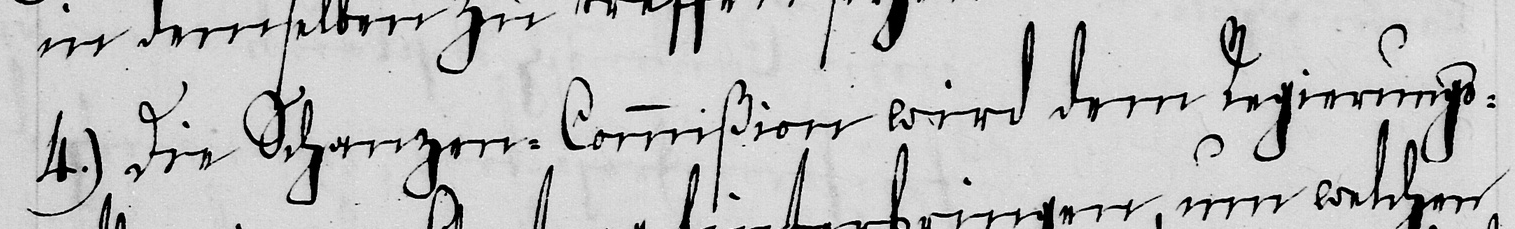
4.) Die Schanzen-Commißion wird dem Regierungs¬
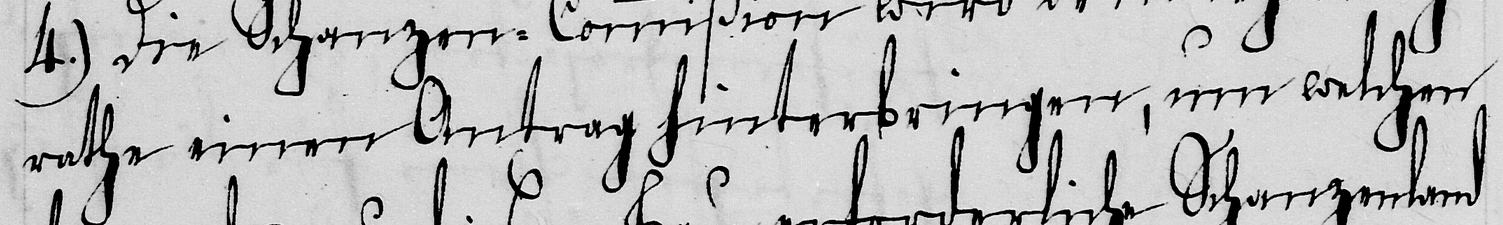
rathe einen Antrag hinterbringen, um welchen
